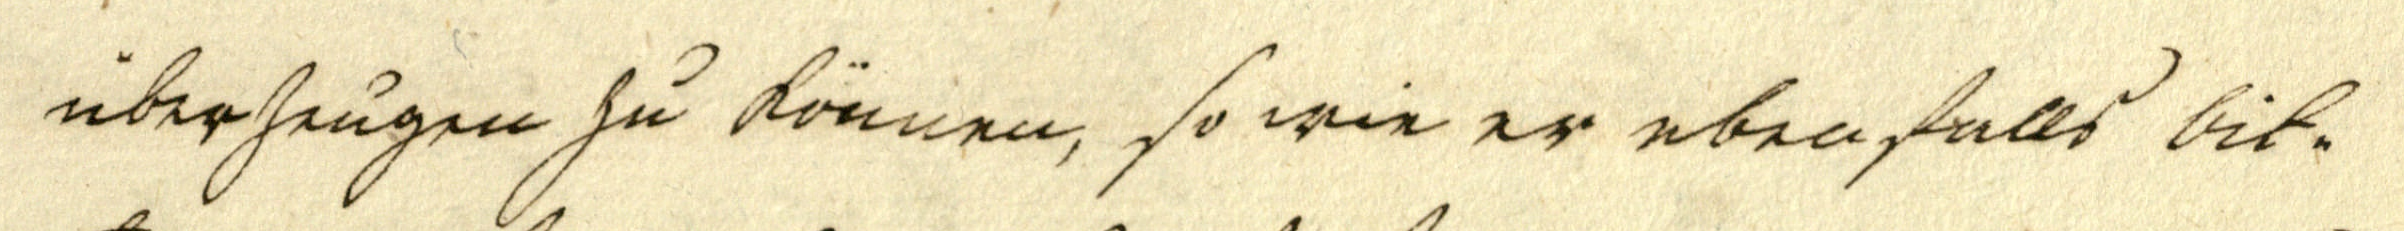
überzeugen zu können, sowie er ebenfalls bit¬
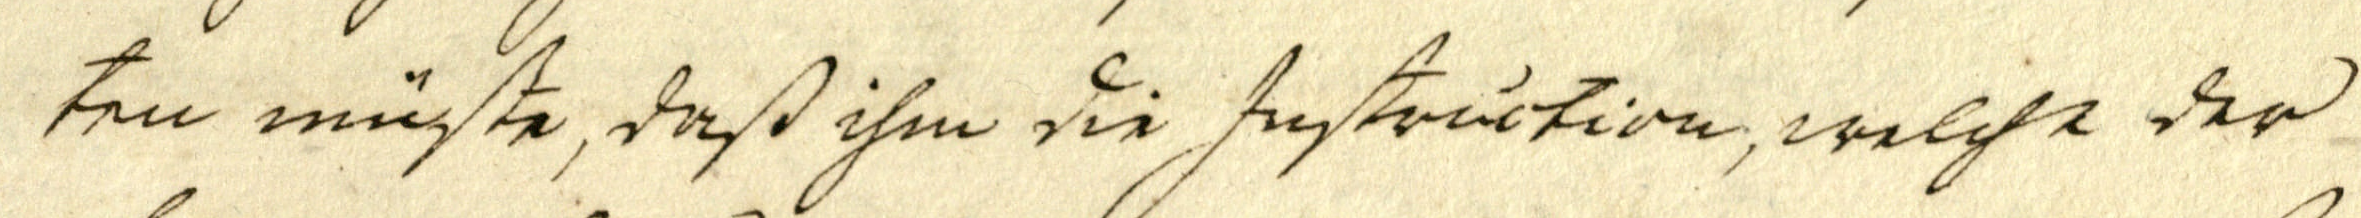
ten müste, daß ihm die Instruction, welche der
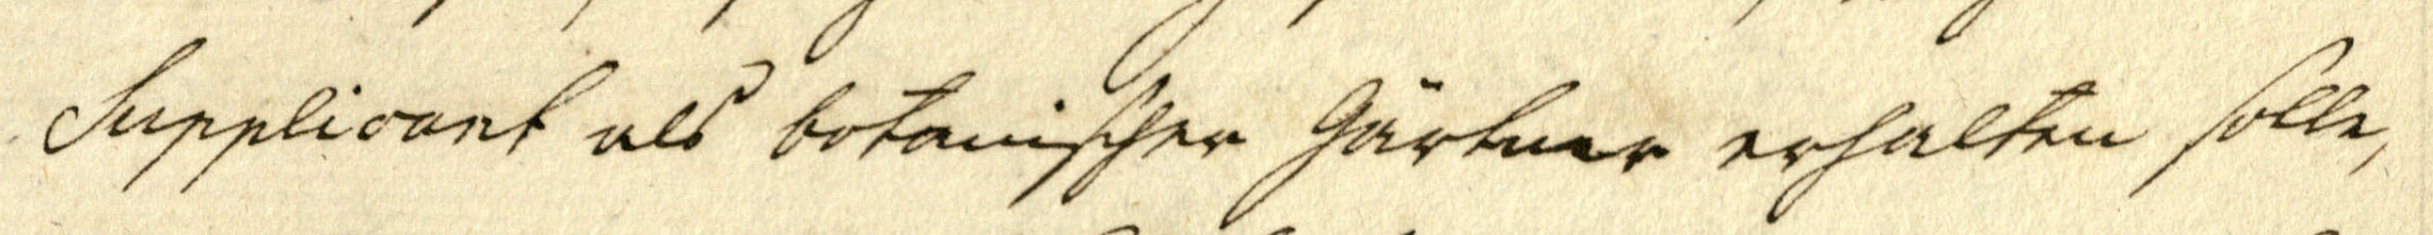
Supplicant als botanischer Gärtner erhalten solle,
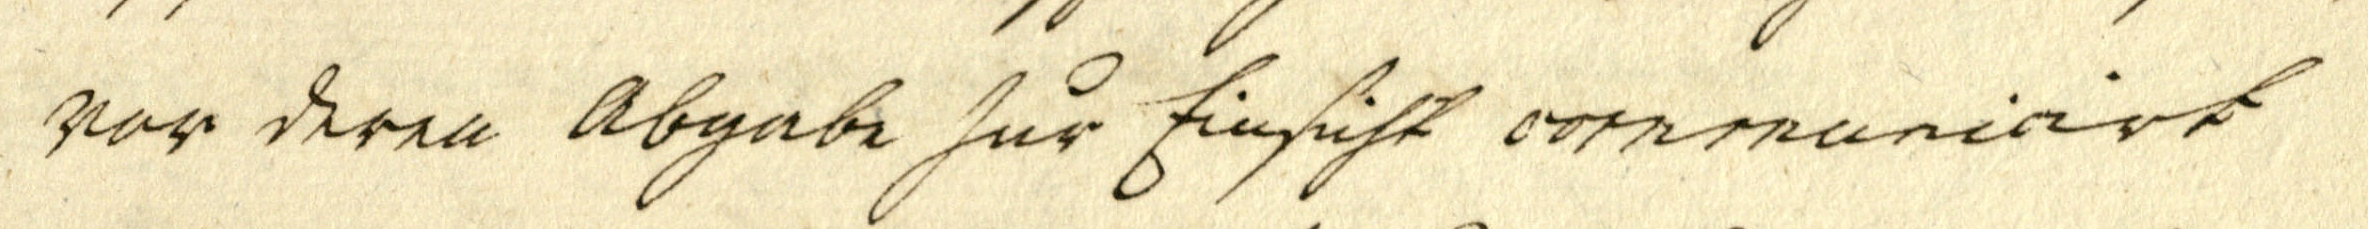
vor deren Abgabe zur Einsicht communicirt
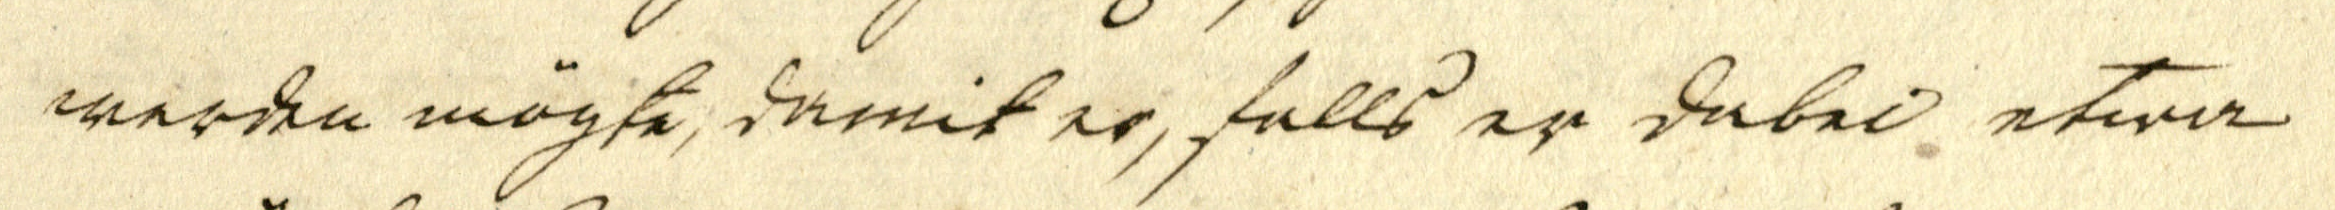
werden mögte, damit es, falls er dabei etwa
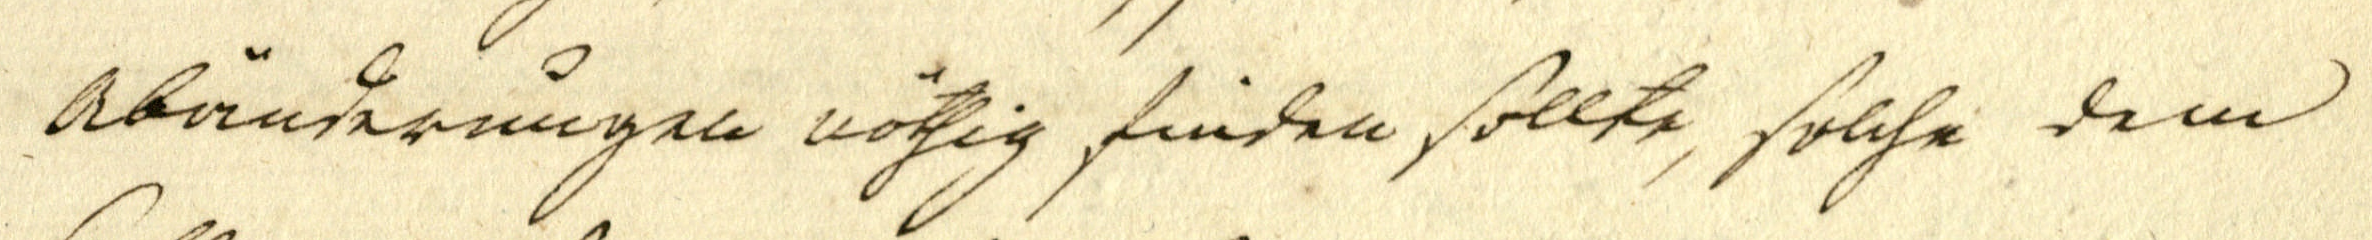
Abänderungen nöthig finden sollte, solche dem
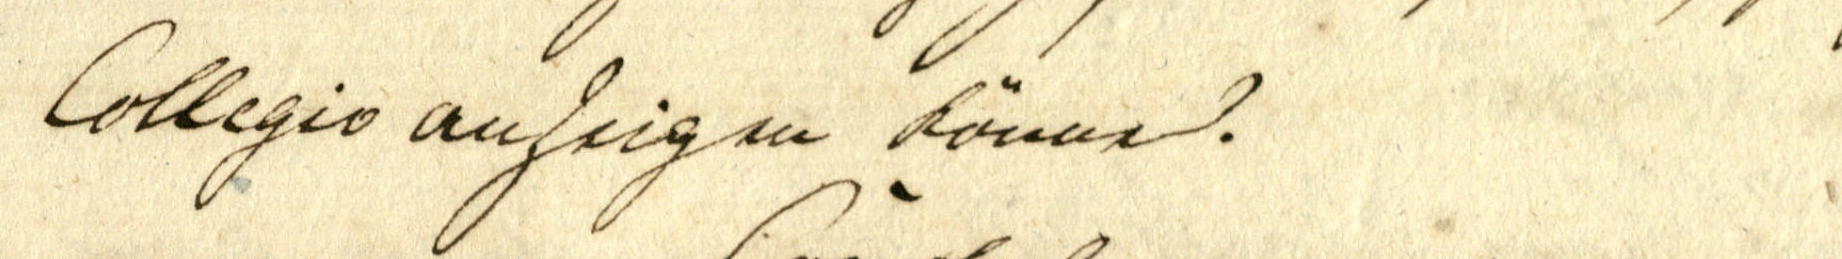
Collegio anzeigen könne.
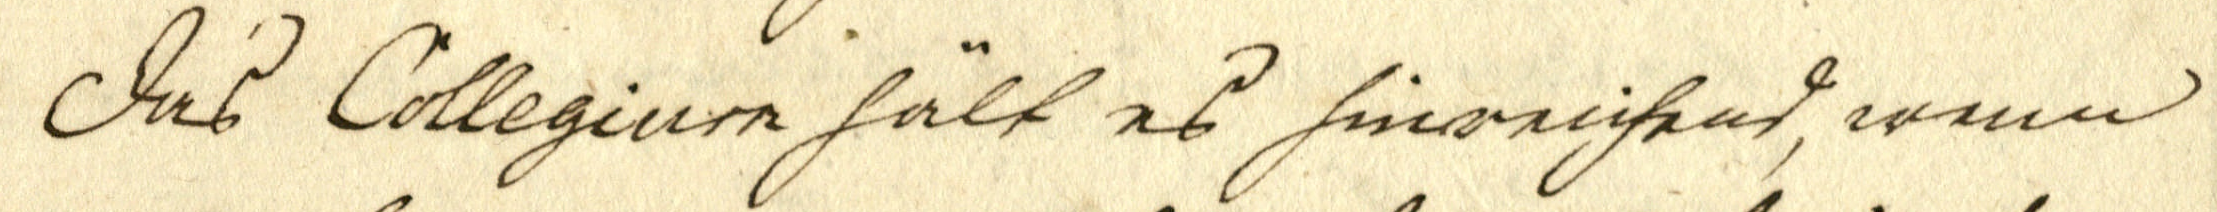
Das Collegium hält es hinreichend, wenn
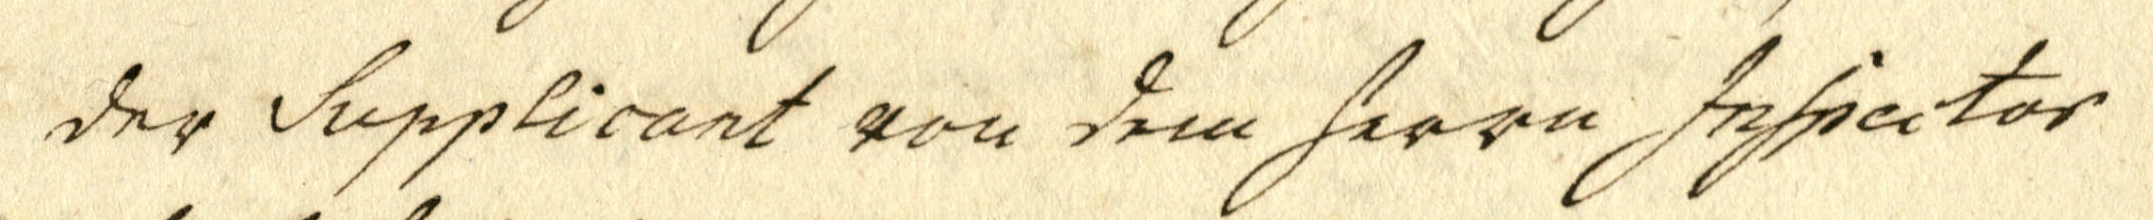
der Supplicant von dem herrn Inspector
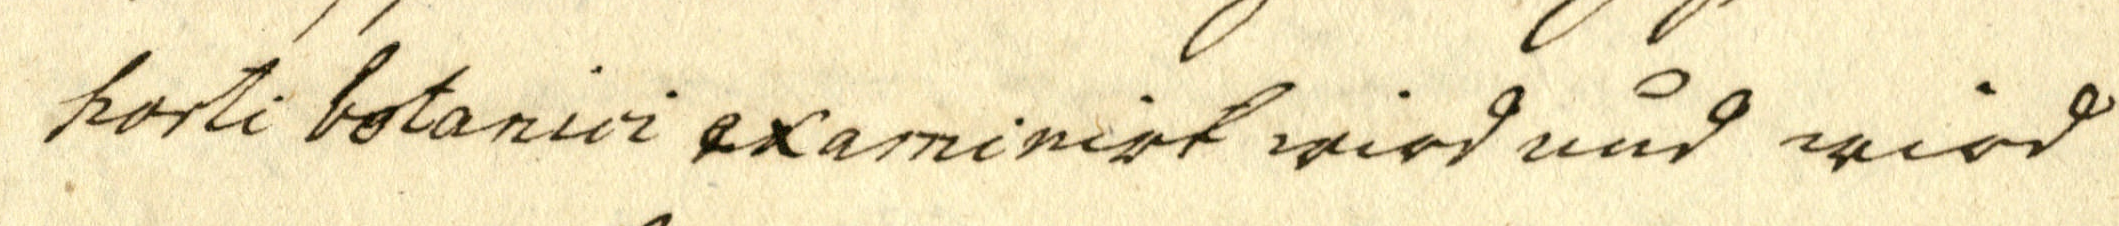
horti botanici examinirt wird und wird
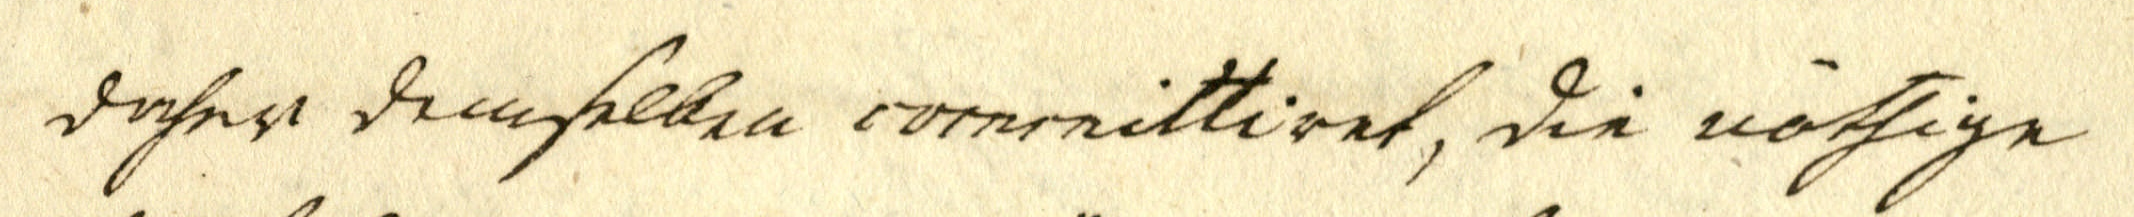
daher demselben committiret, die nöthige
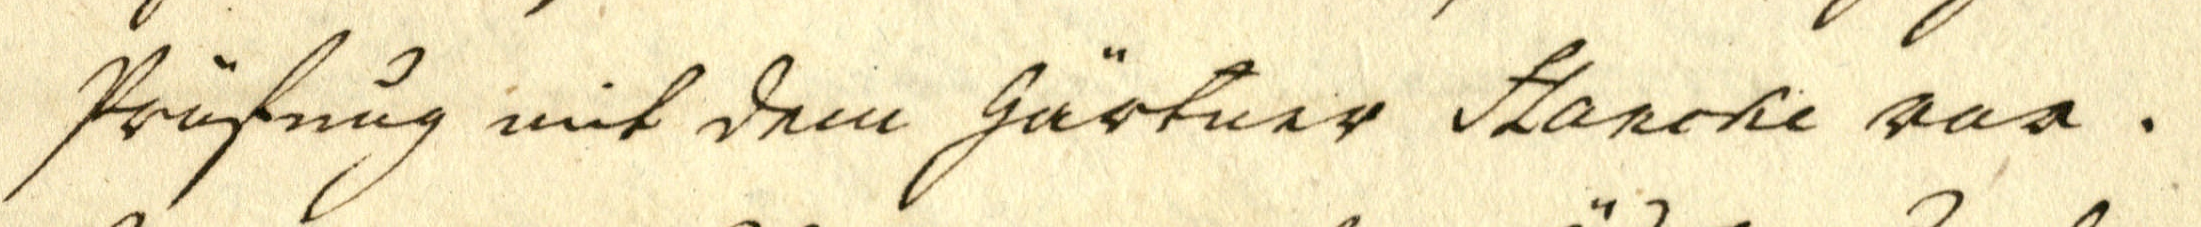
Prüfung mit dem Gärtner Hancke vor¬
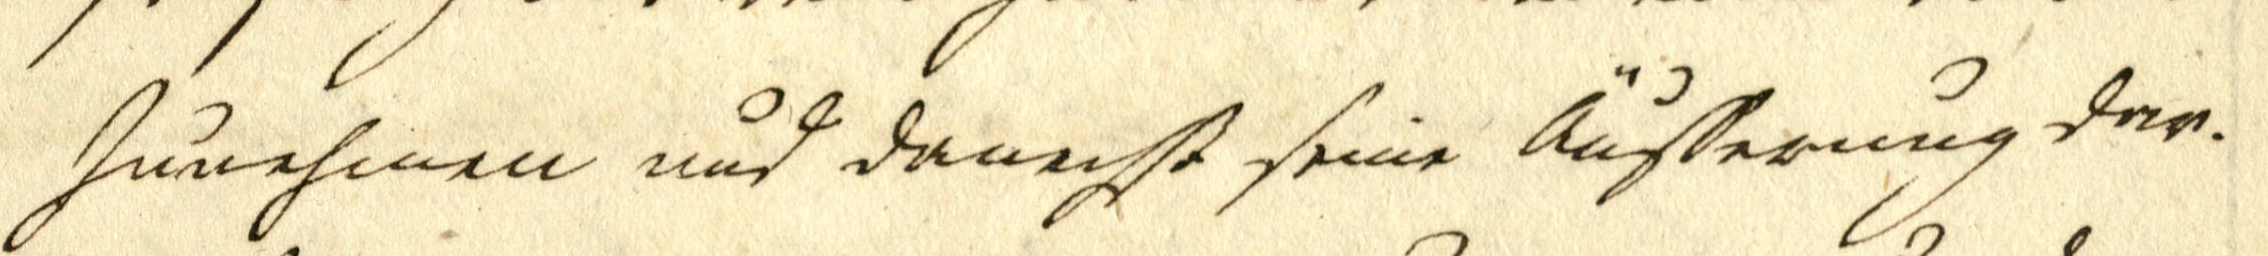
zunehmen und danechst seine Äusserung dar¬
